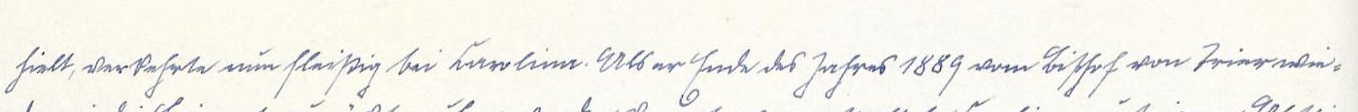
hielt, verkehrte nun fleißig bei Carolina. Als er Ende des Jahres 1889 vom Bischof von Trier wie-
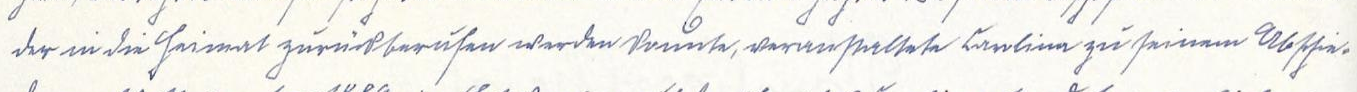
der in die Heimat zurückberufen werden konnte, veranstaltete Carolina zu seinem Abschie-
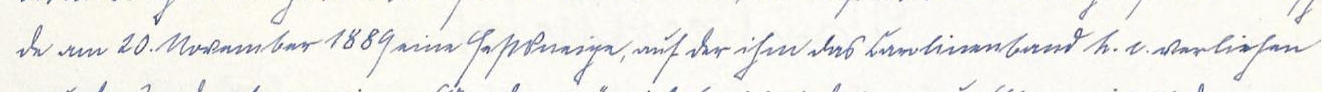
de am 20. November 1889 eine Festkneipe, auf der ihm das Carolinenband h. c. verliehen
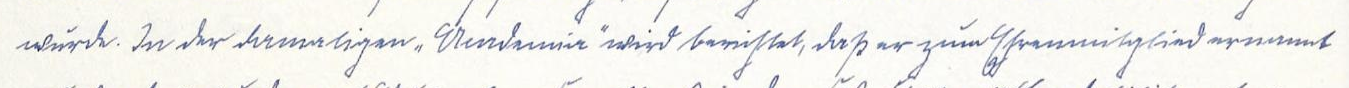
wurde. In der damaligen „Academia" wird berichtet, dass er zum Ehrenmitglied ernannt
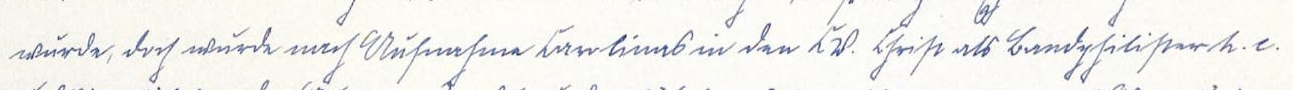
wurde, doch wurde nach Aufnahme Carolinas in den CV Christ als Bandphilister h. c.
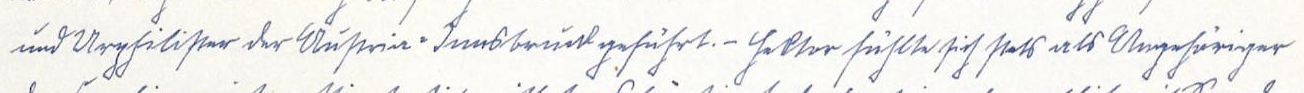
und Urphilister der Austria- Innsbruck geführt.- Hektor fühlte sich stets als Angehöriger
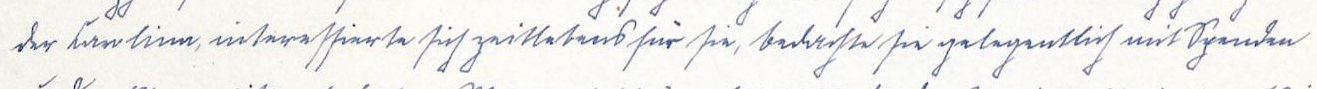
der Carolina, interessierte sich zeitlebens für sie, bedachte sie gelegentlich mit Spenden
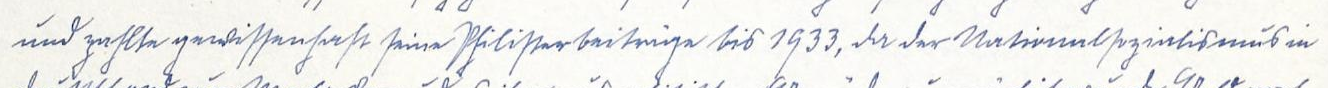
und zahlte gewissenhaft seine Philisterbeiträge bis 1933, da der Nationalsozialismus in
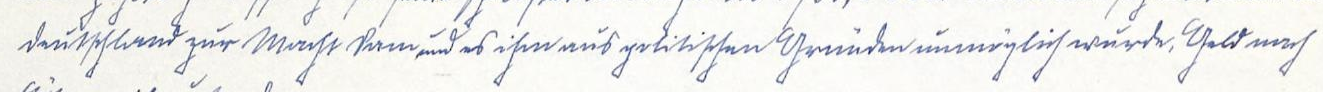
Deutschland zur Macht kam und es ihn aus politischen Gründern unmöglich wurde, Geld nach
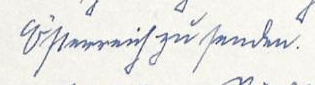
Österreich zu senden.
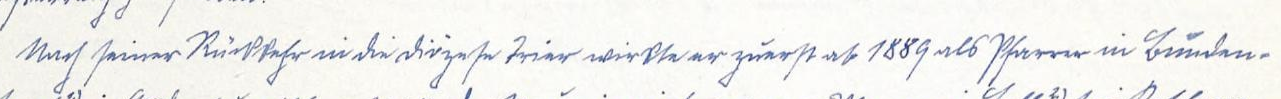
Nach seiner Rückkehr in die Diözese Trier wirkte er zuerst ab 1889 als Pfarrer in Bunden-
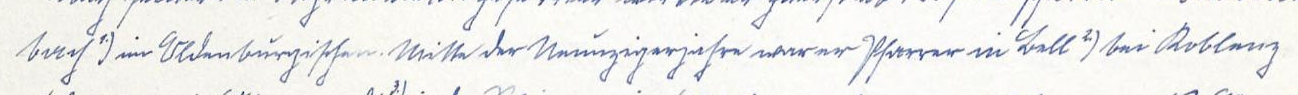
bach im Oldenburgischen. Mitte der Neunzigerjahre war er Pfarrer in Bell 2) bei Koblenz
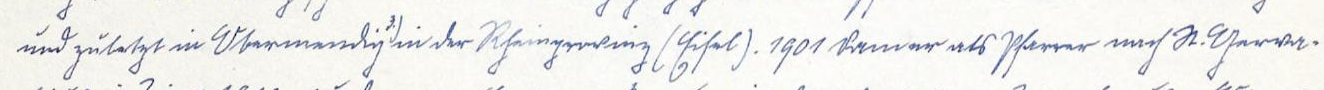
und zuletzt in Obermendig in der Rheinprovinz (Eifel). 1901 kam er als Pfarrer nach St. Gervar-
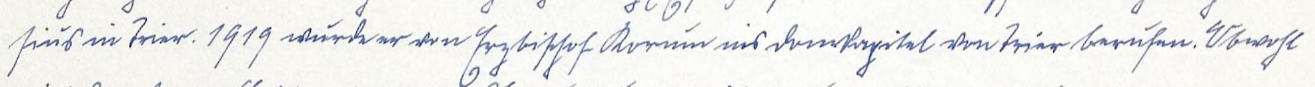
sius in Trier. 1919 wurde er von Erzbischof Korun ins Domkapitel von Trier berufen. Obwohl
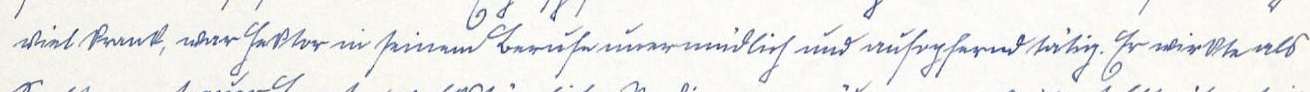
viel krank, war Hektor in seinem Beruf unermüdlich und aufopfernd tätig. Er wirkte als
